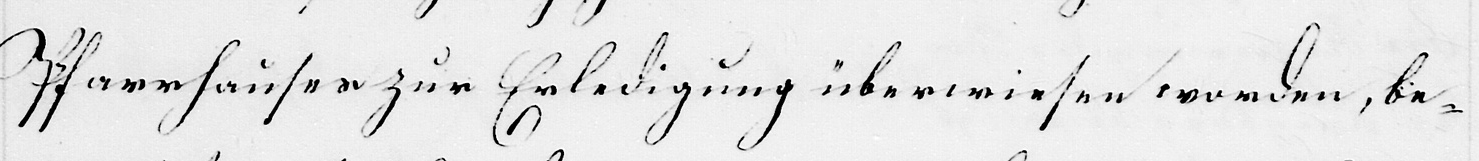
Pfarrhauses zur Erledigung überwiesen worden, be¬
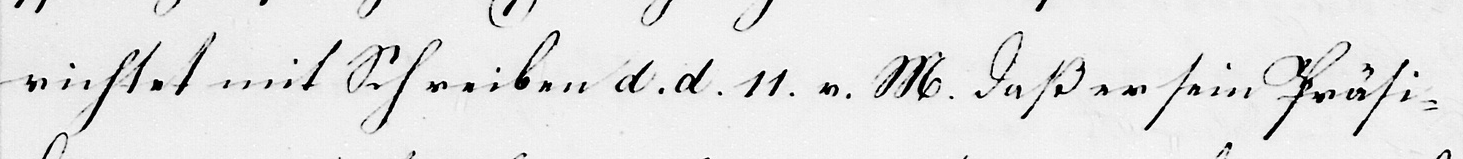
richtet mit Schreiben d. d. 11. v. M. daß er sein Präsi¬
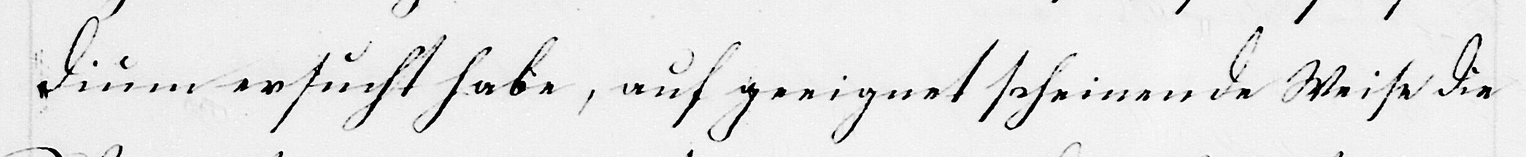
dium ersucht habe, auf geeignet scheinende Weise die
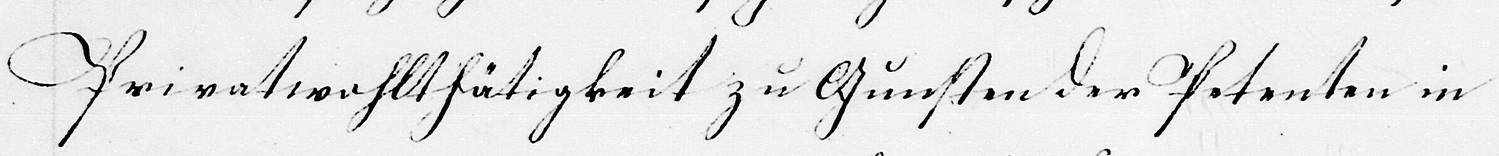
Privatwohlthätigkeit zu Gunsten der Petenten in
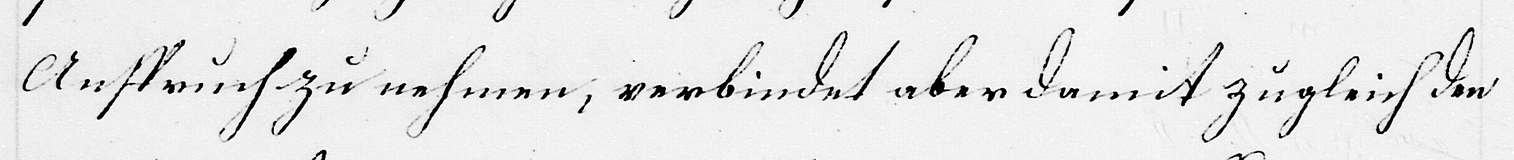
Anspruch zu nehmen, verbindet aber damit zugleich den
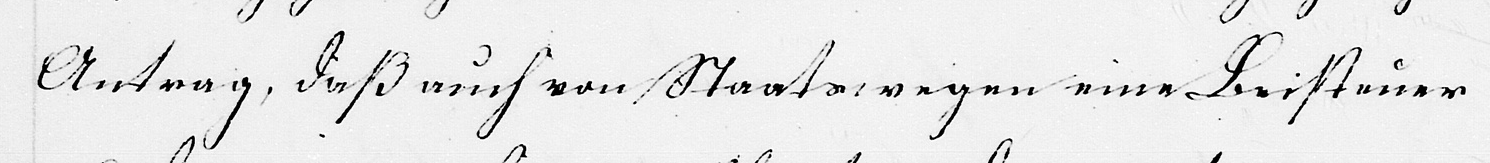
Antrag, daß auch von Staatswegen eine Beisteuer
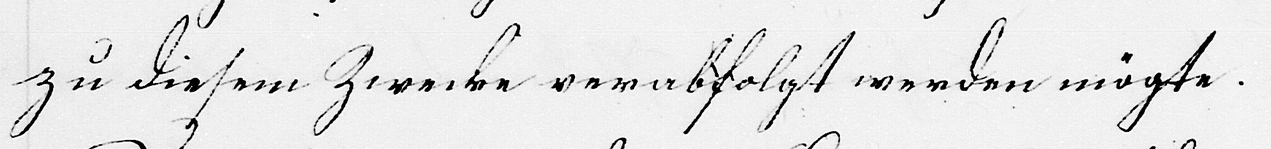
zu diesem Zwecke verabfolgt werden mögte.
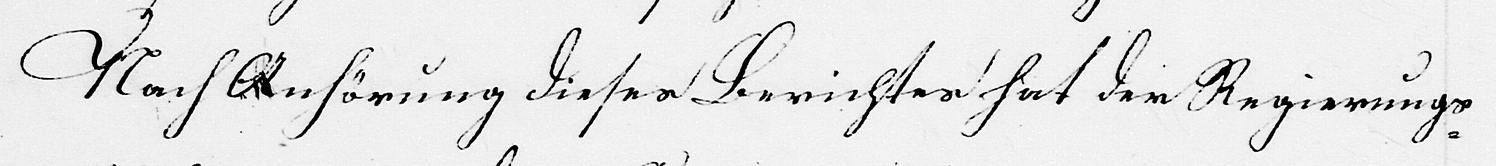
Nach Anhörung dieses Berichtes hat der Regierungs¬
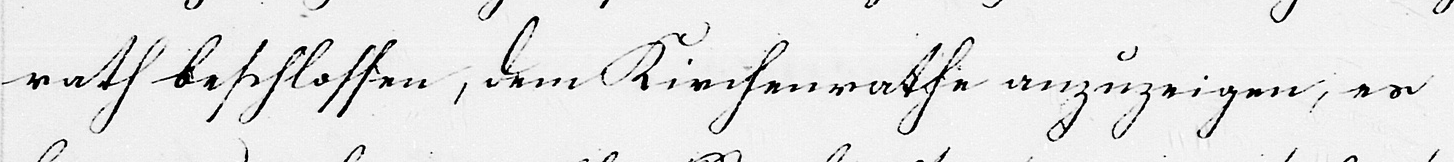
rath beschlossen, dem Kirchenrathe anzuzeigen, es
